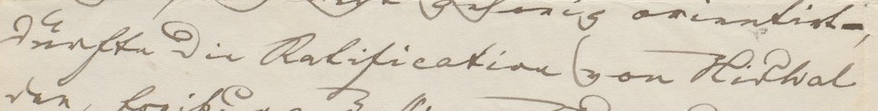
dürfte die Ratification von Nidwal-
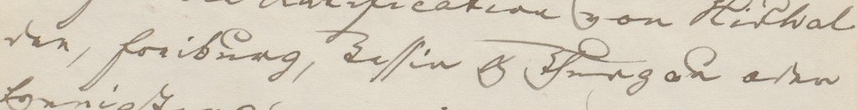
den, Freiburg, Tessin & Thurgau oder
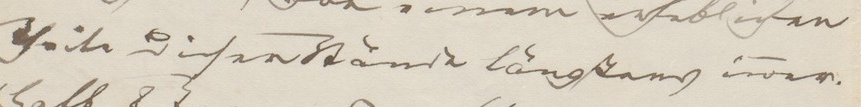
Theile dieser Stände längstens inner-
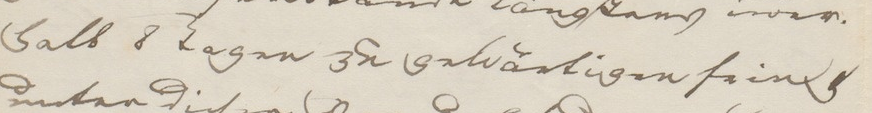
halb 8 Tagen zu gewärtigen sein &
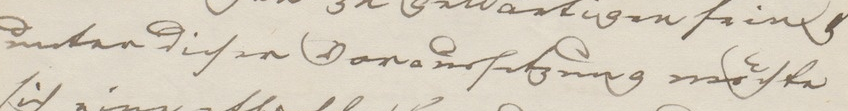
unter dieser Voraussetzung möchte
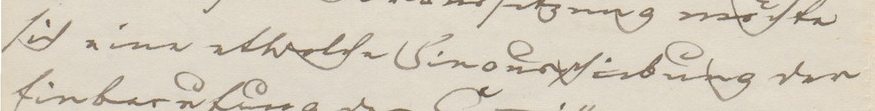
sich eine etwelche Hinausschiebung der
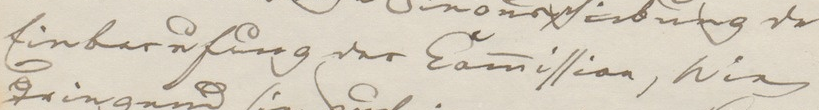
Einberufung der Commission, wie
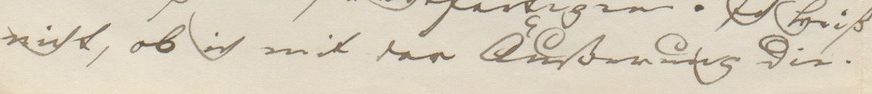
nicht, ob ich mit der Äußerung die-
